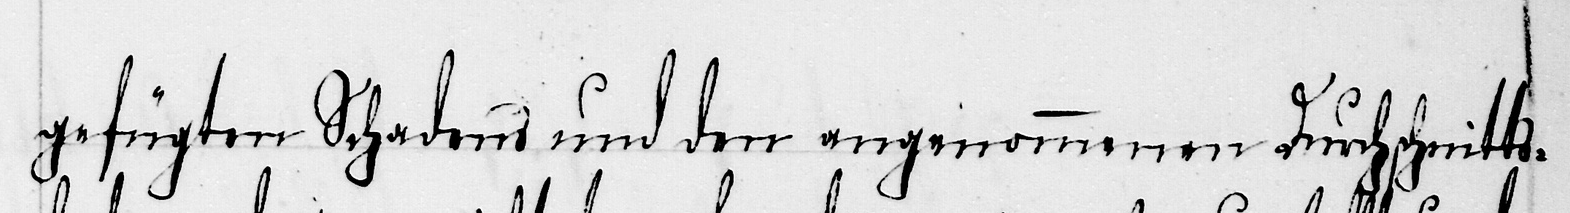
gefügten Schadens und den angenommenen Durchschnit¬
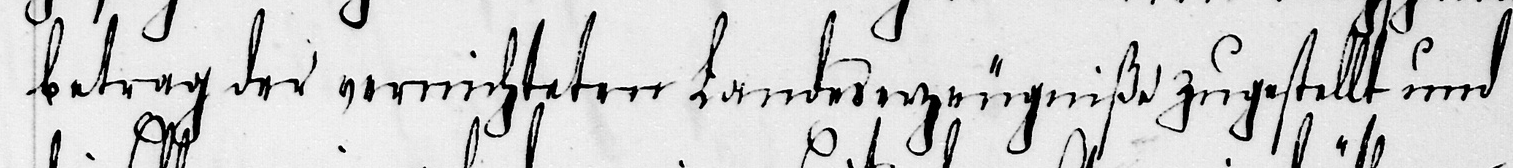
betrag der vernichteten Landeserzeugniße zugestellt und
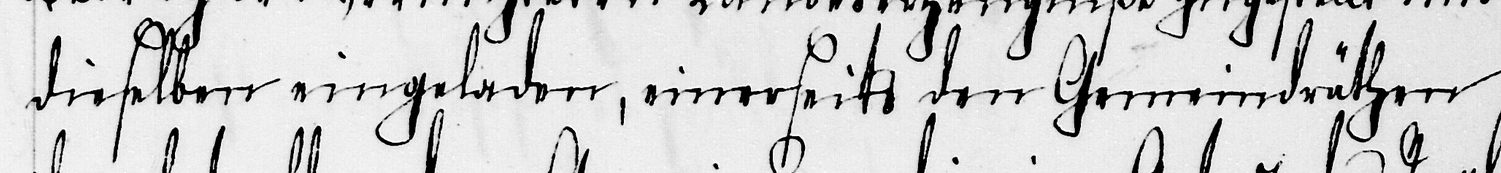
dieselben eingeladen, einerseits den Gemeindräthen
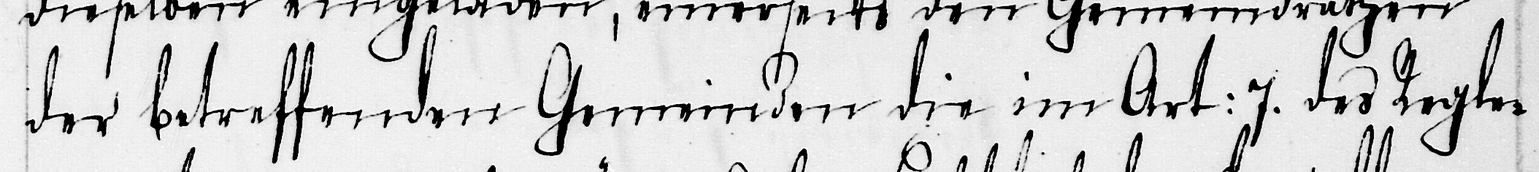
der betreffenden Gemeinden die im Art: 7. des Regle¬
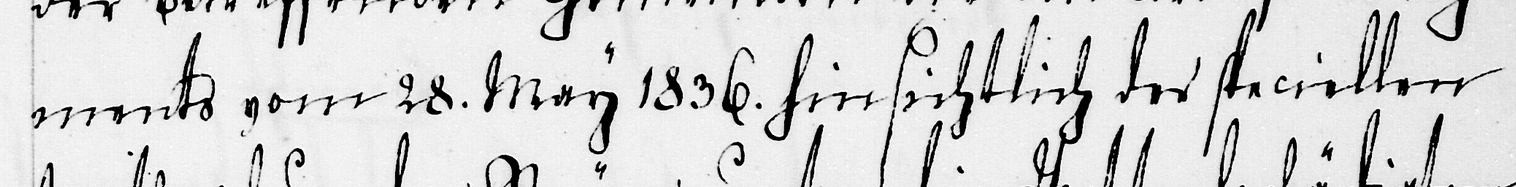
ments vom 28. März 1836. hinsichtlich der speciellen
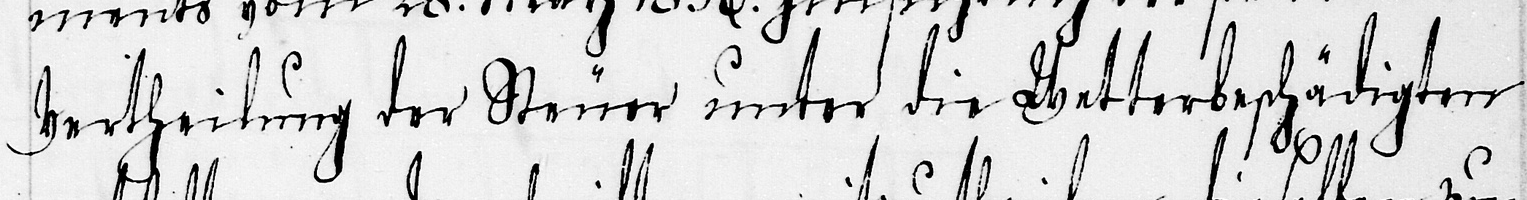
Vertheilung der Steuer unter die Wetterbeschädigten
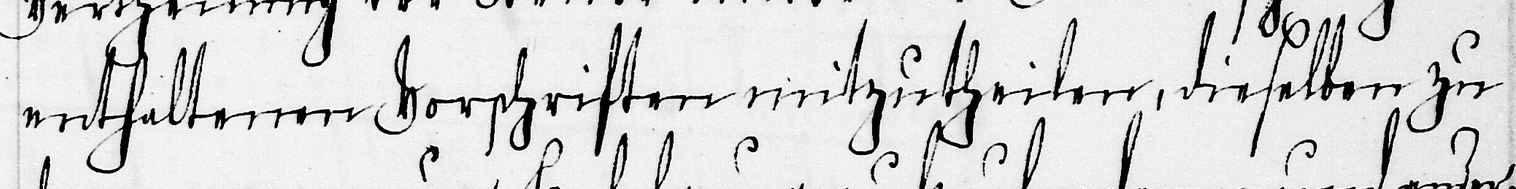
enthaltenen Vorschriften mitzutheilen, dieselben zu
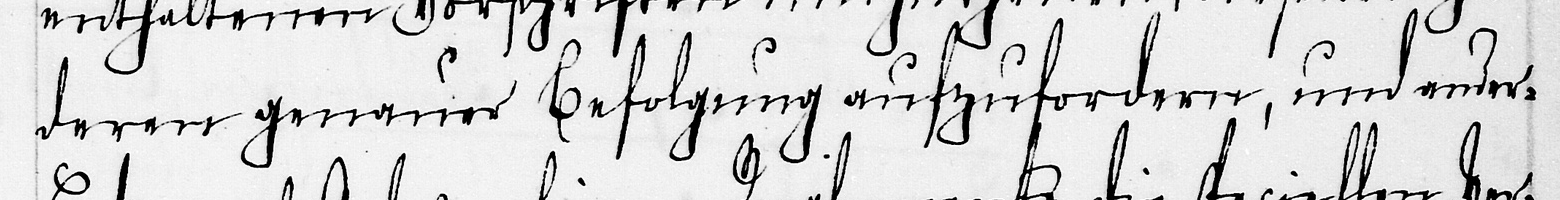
deren genauer Befolgung aufzufordern, und ander¬
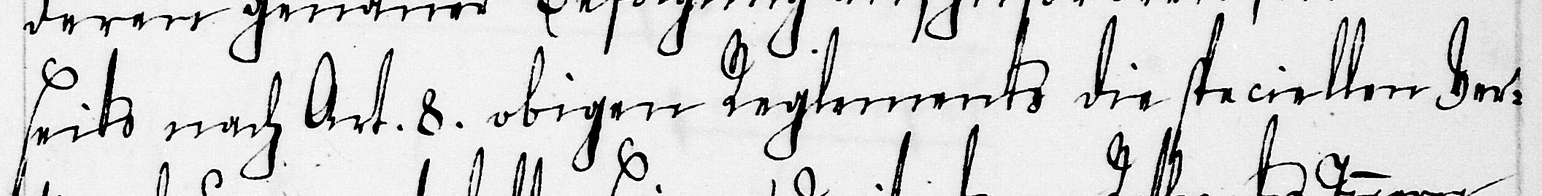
seits nach Art. 8. obigen Reglements die speciellen Ver¬
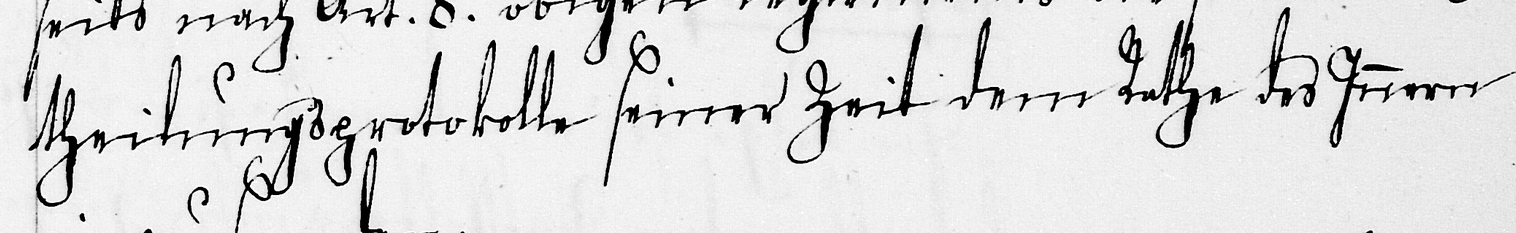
theilungsprotokolle seiner Zeit dem Rathe des Innern
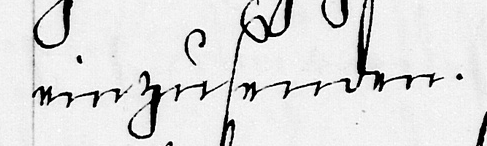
einzusenden.
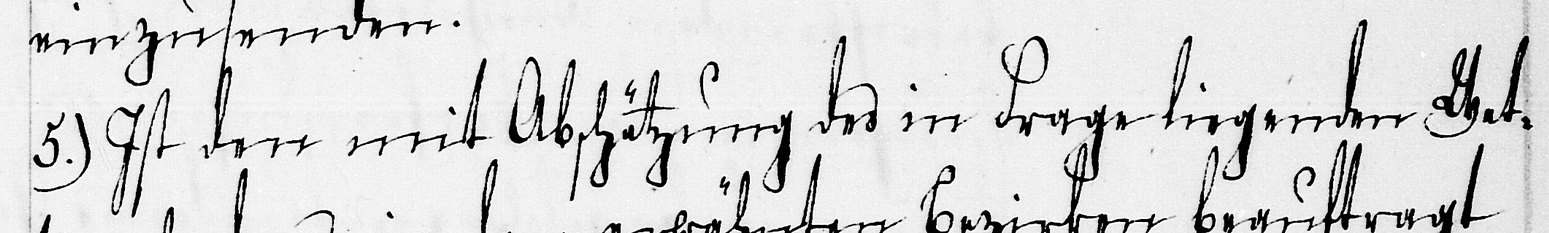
5.) Ist den mit Abschätzung des in Frage liegenden Wet¬
